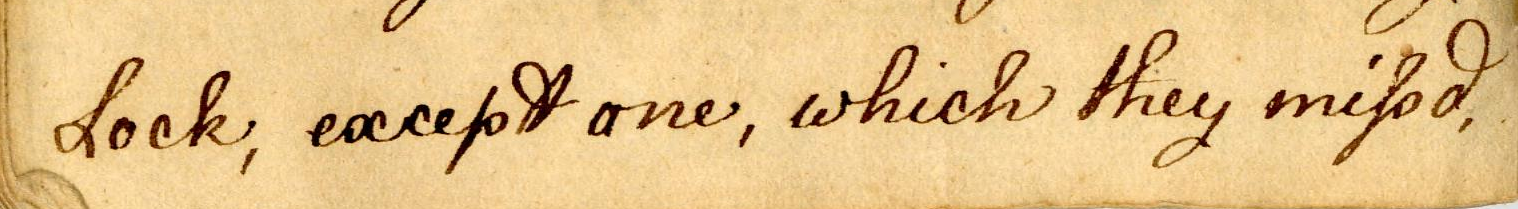Lock, except one, which they missd,
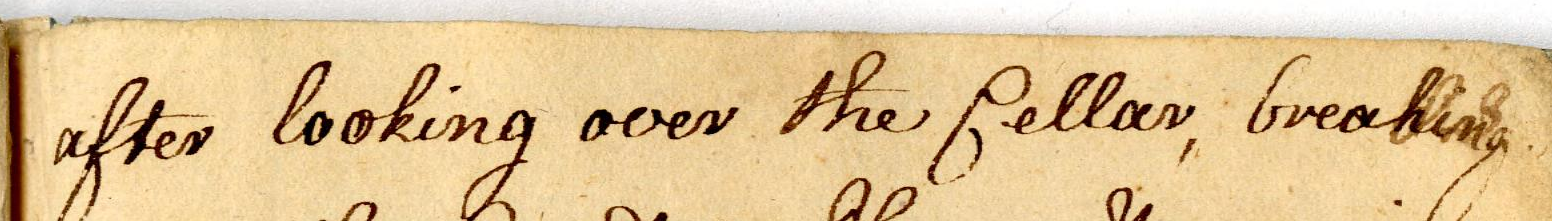after looking over the Cellar, breaking
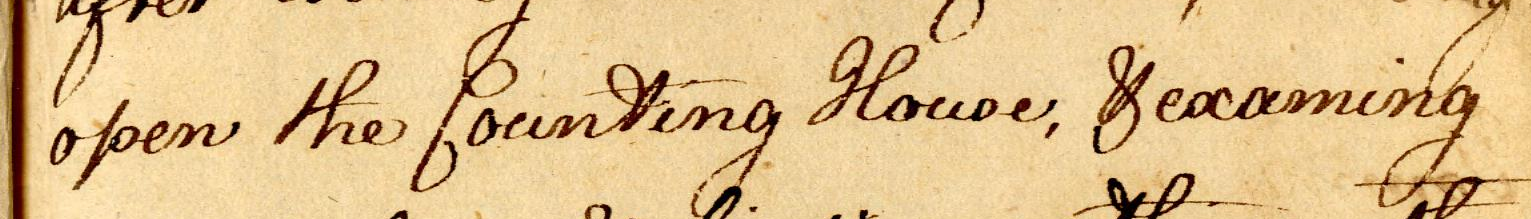open the Counting House, & examing
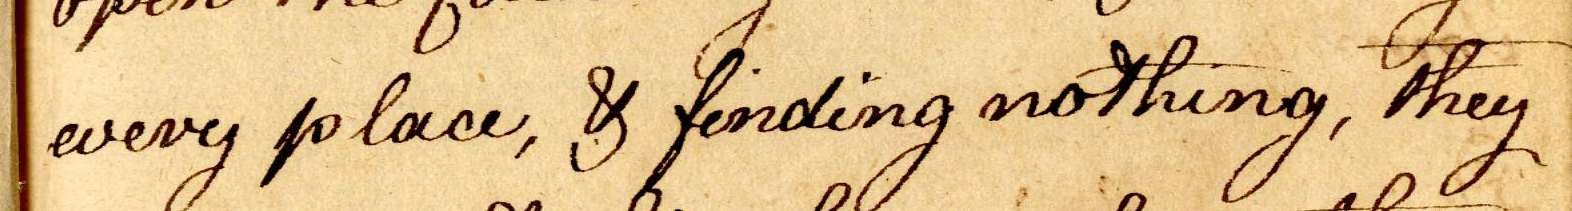every place, & finding nothing, they
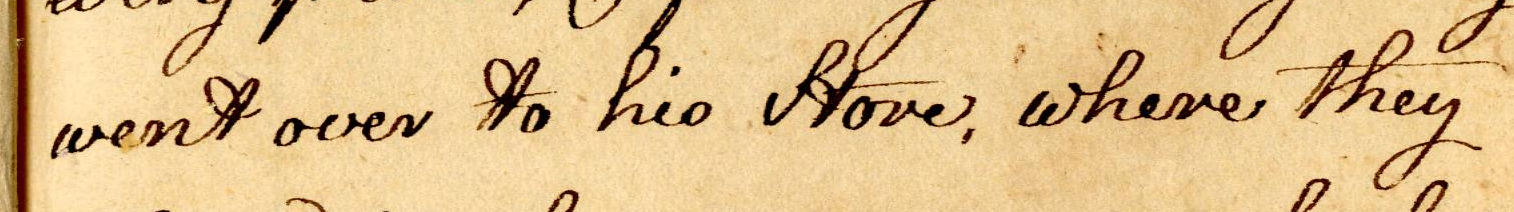went over to his Stove, where they
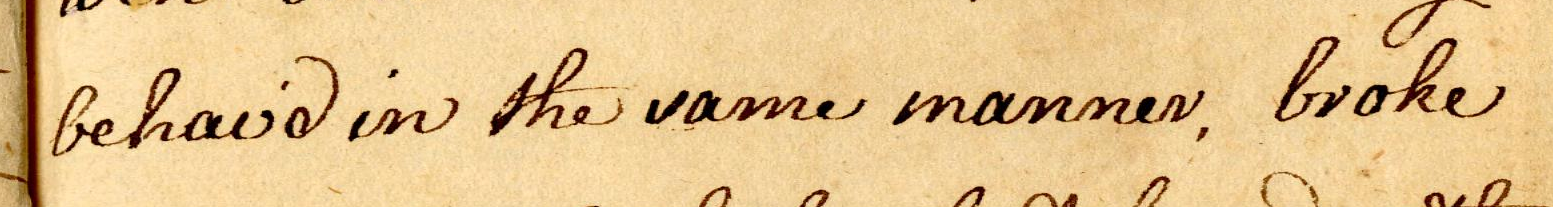behav'd in the same manner, broke
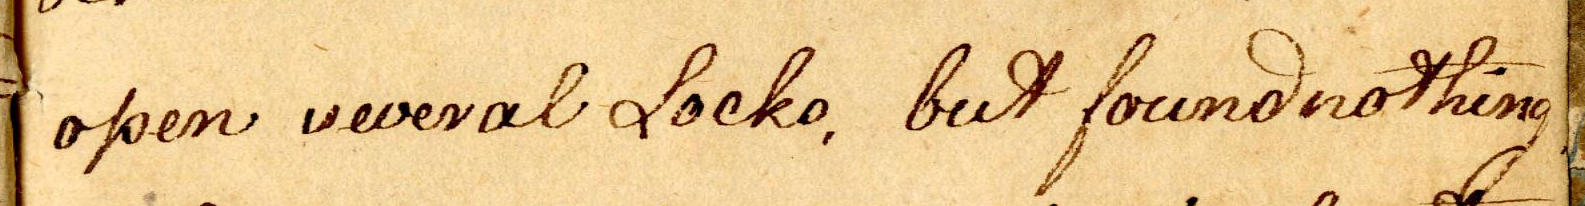open several Locks, but found nothing
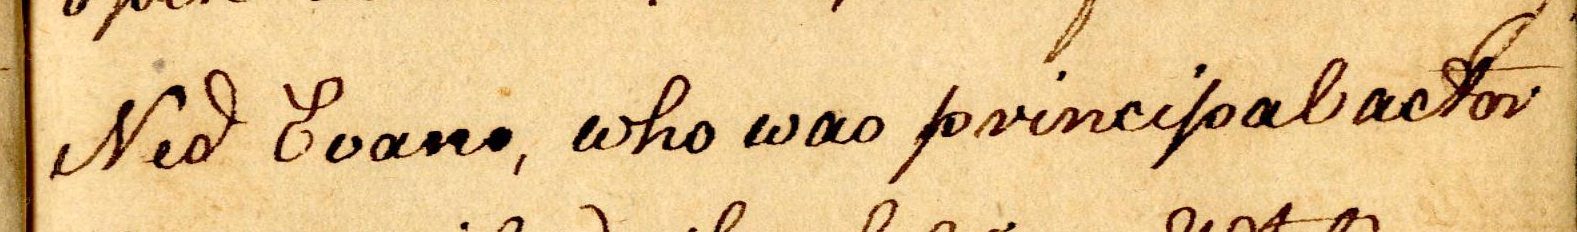Ned Evans, who was principal actor
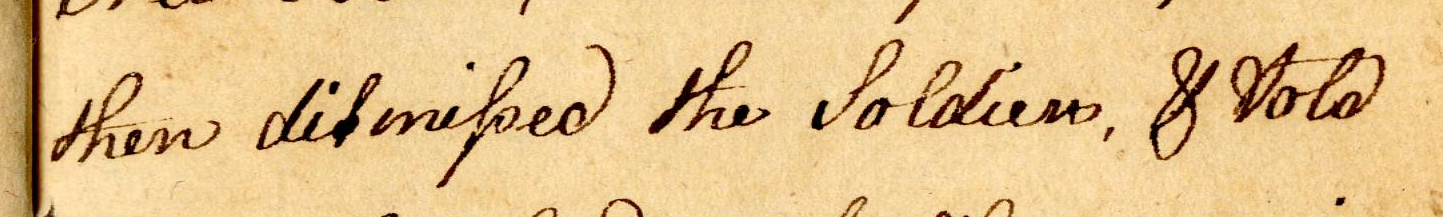then dismissed the Soldiers, & told
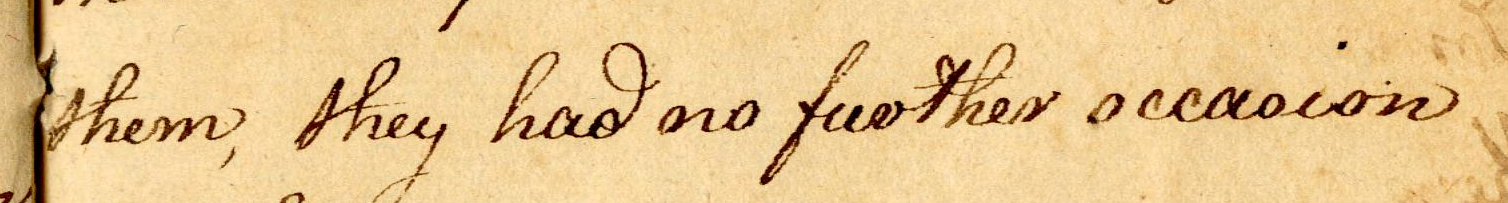them, they had no further occasion
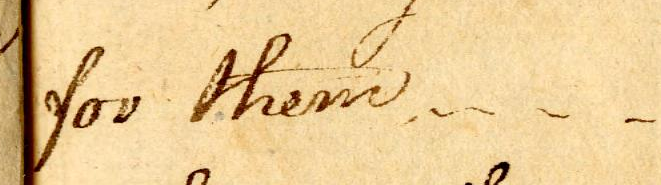for them-
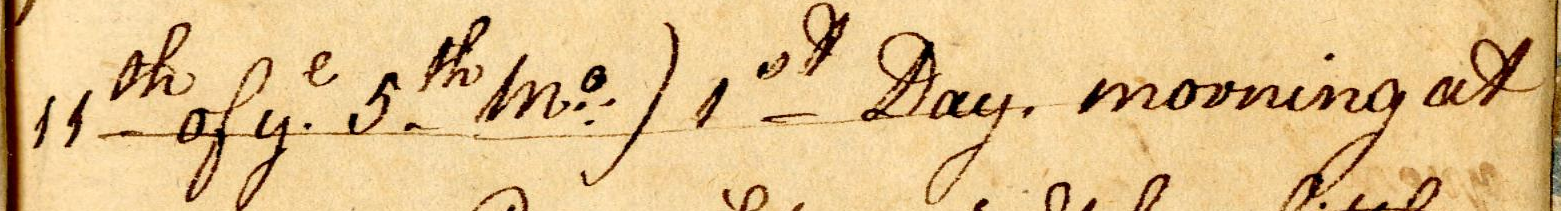11^th of y^e. 5^th. M^o.) 1^st Day. morning at
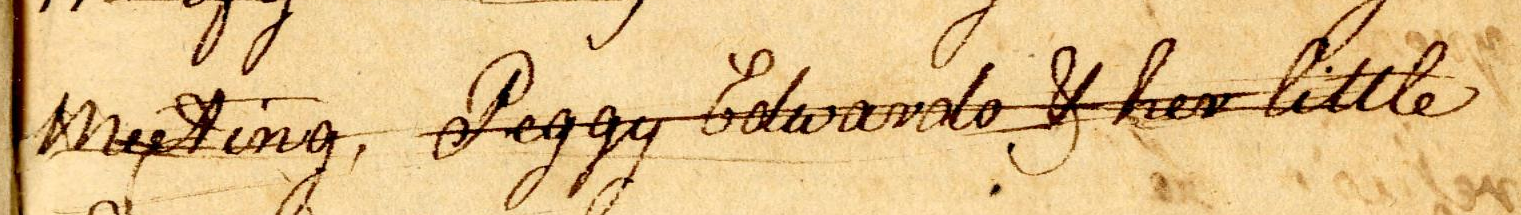[Meeting, Peggy Edwards & her little]
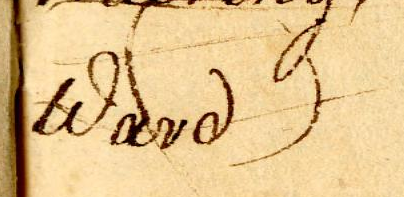Ward)
